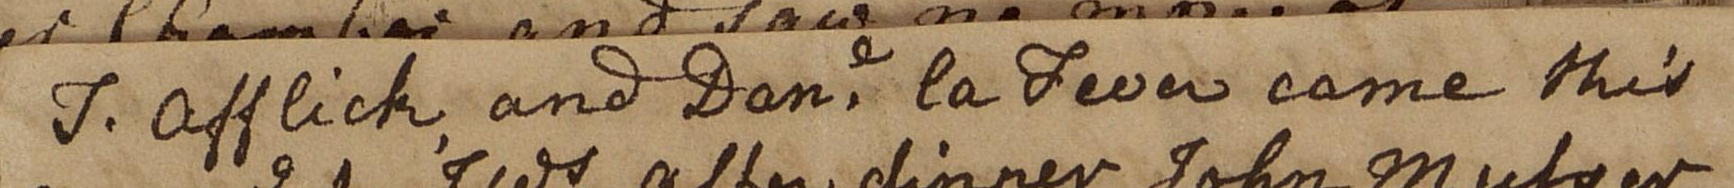T. Afflick and Dan^l. la Fever came this
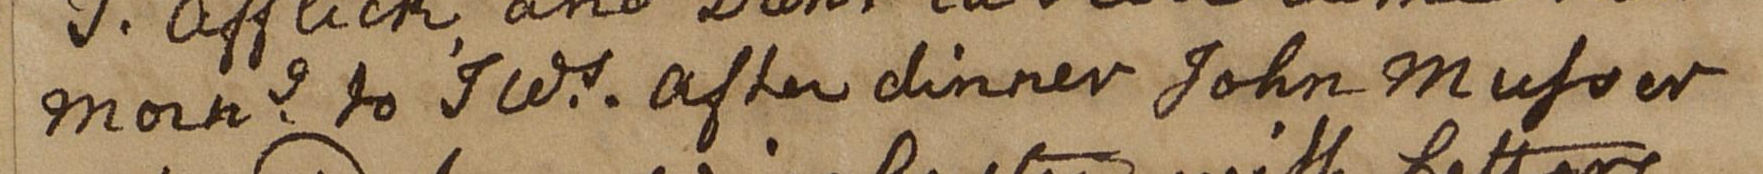morn^g. to TW^s.. after dinner John Musser
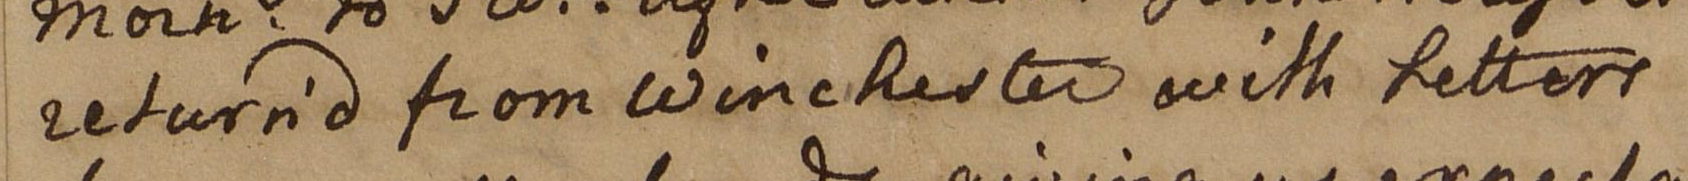return'd from Winchester with Letters
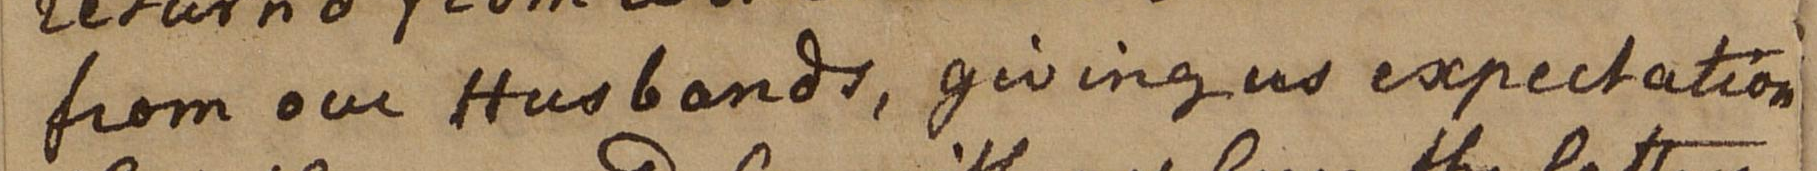from our Husbands, giving us expectation
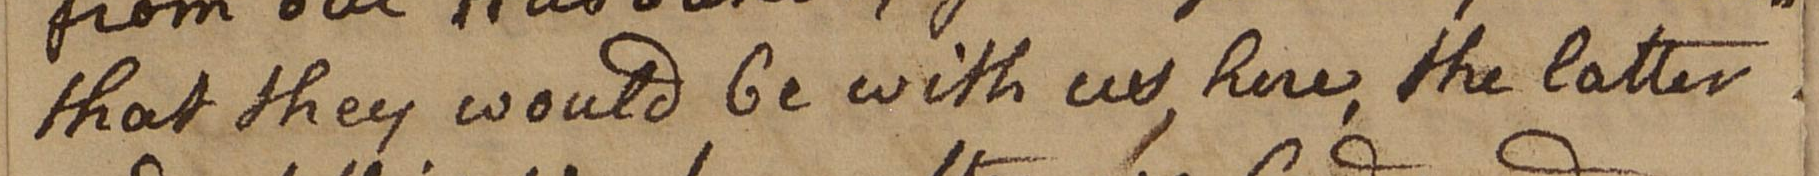that they would be with us here, the latter
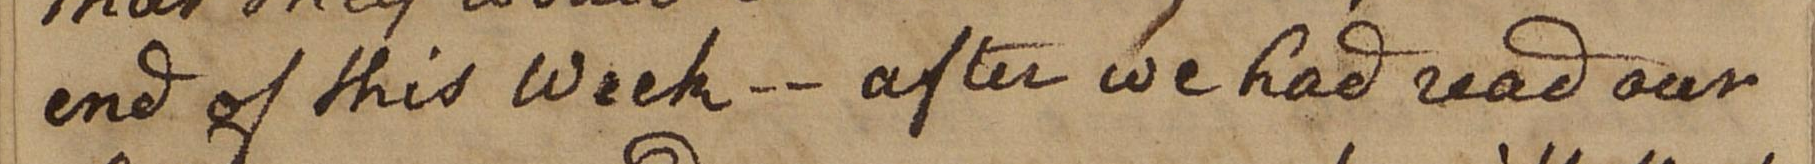end of this week- after we had read our
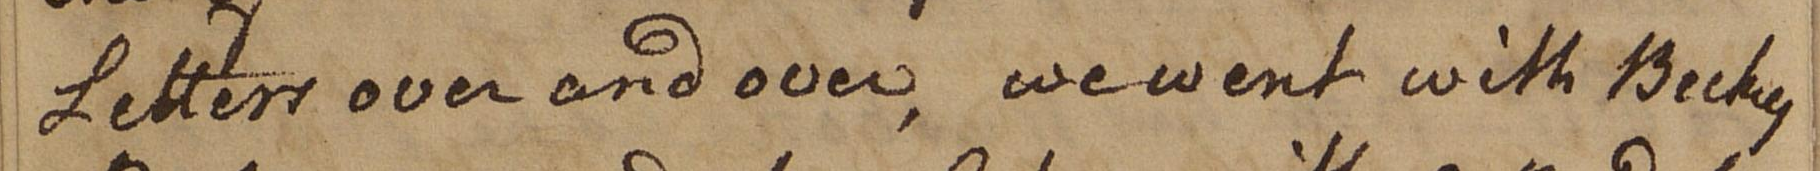Letters over and over, we went with Becky
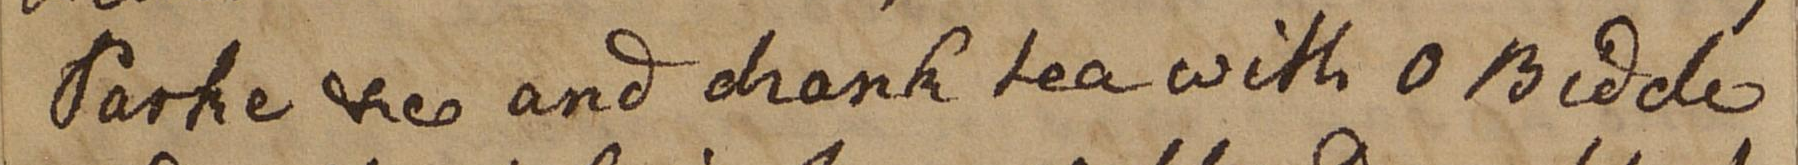Parke &c and drank tea with O Bidde
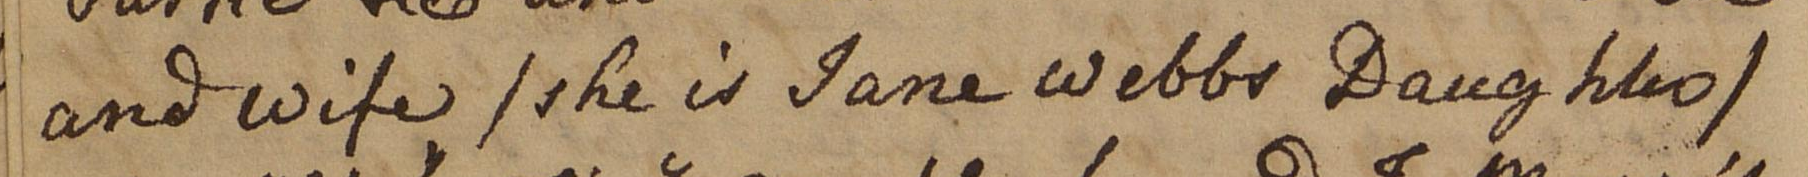and wife /she is Jane Webbs Daughter/
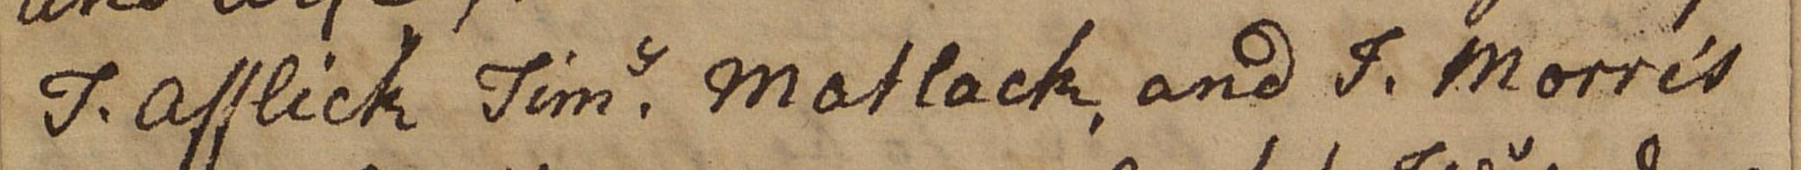T. Afflick Tim^y. Matlack, and F. Morris
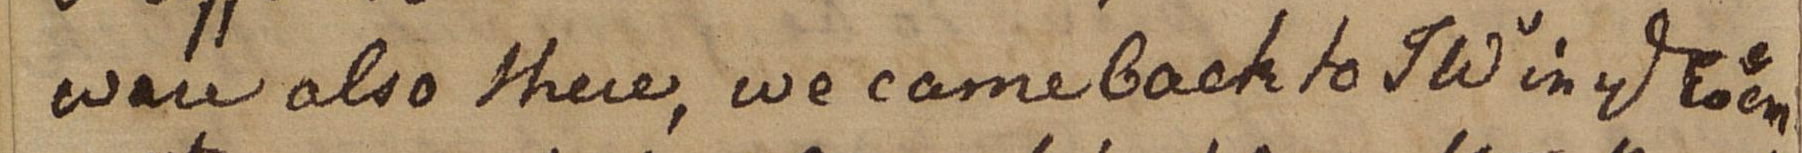ware also there, we came back to T W^s in y^e Even^g
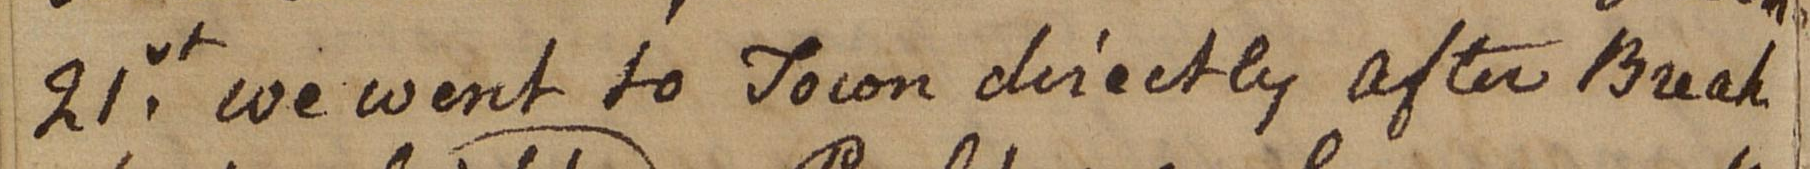21^st. we went to Town directly after Break
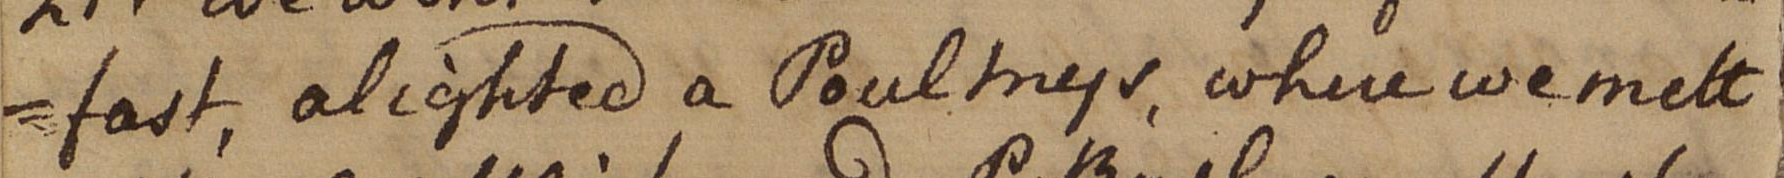-fast, alighted a Poultnys, where we mett
